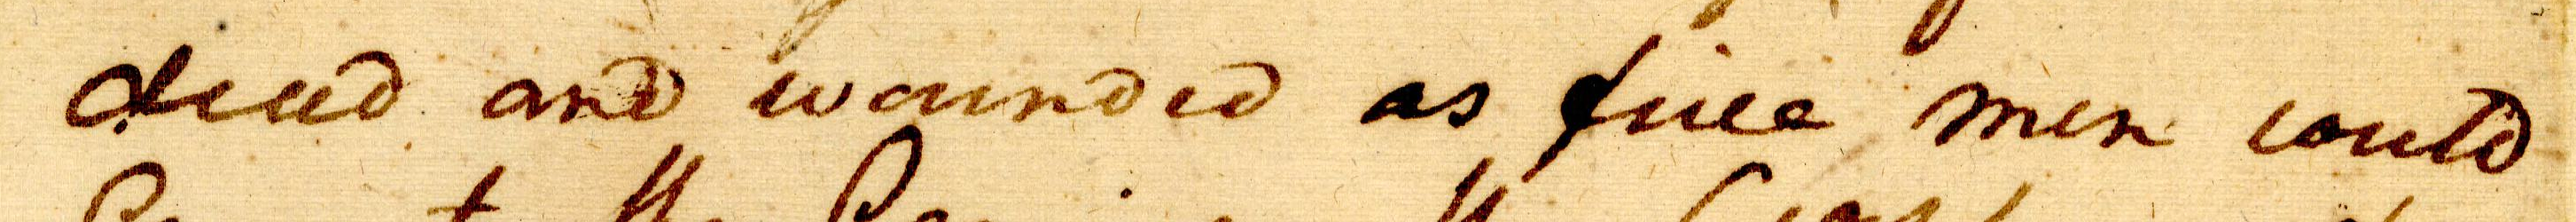dead and wounded as five men could
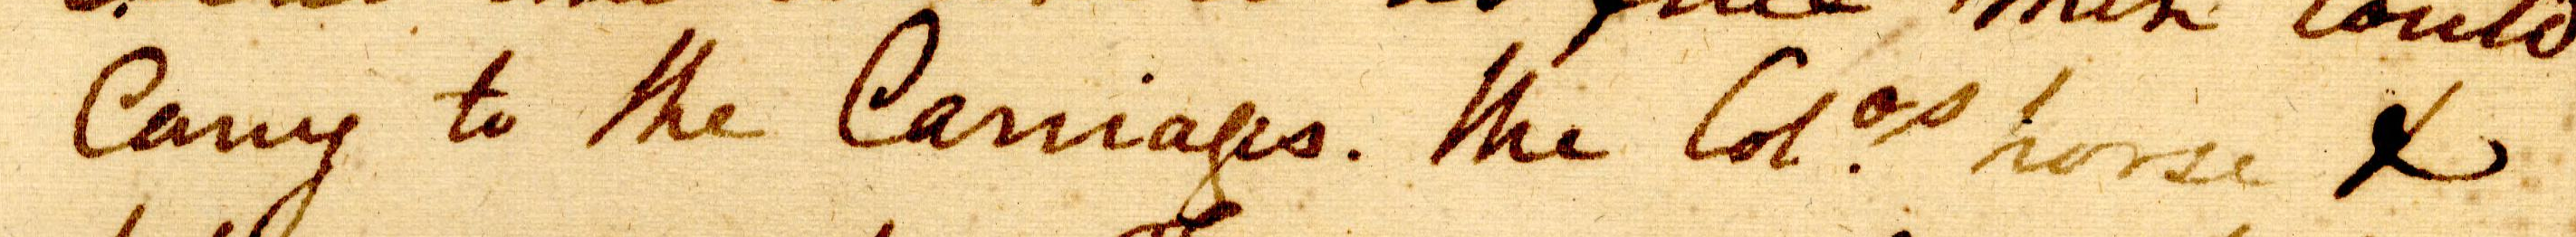Carry to the Carriages. the Col^os. horse &
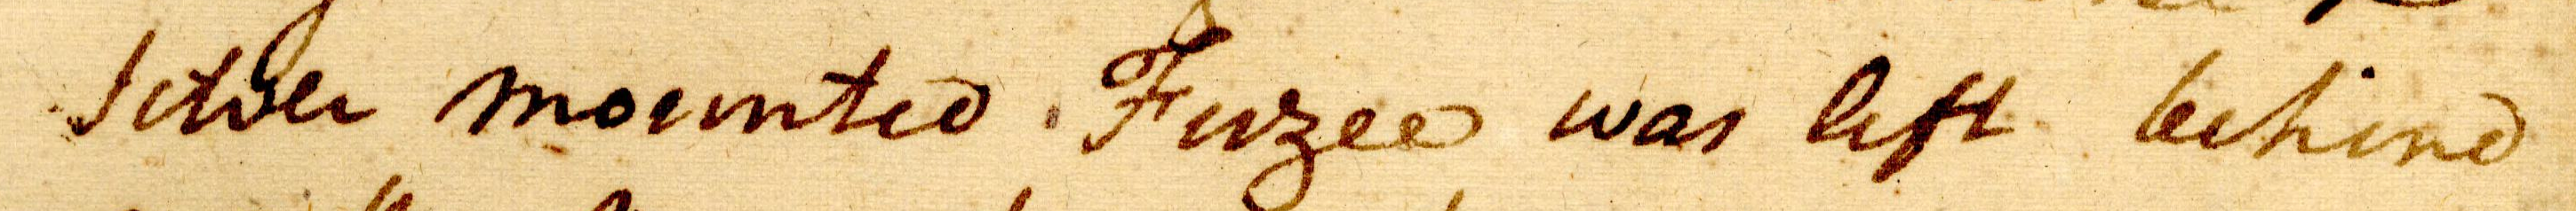Silver mounted Fuzee was left behind
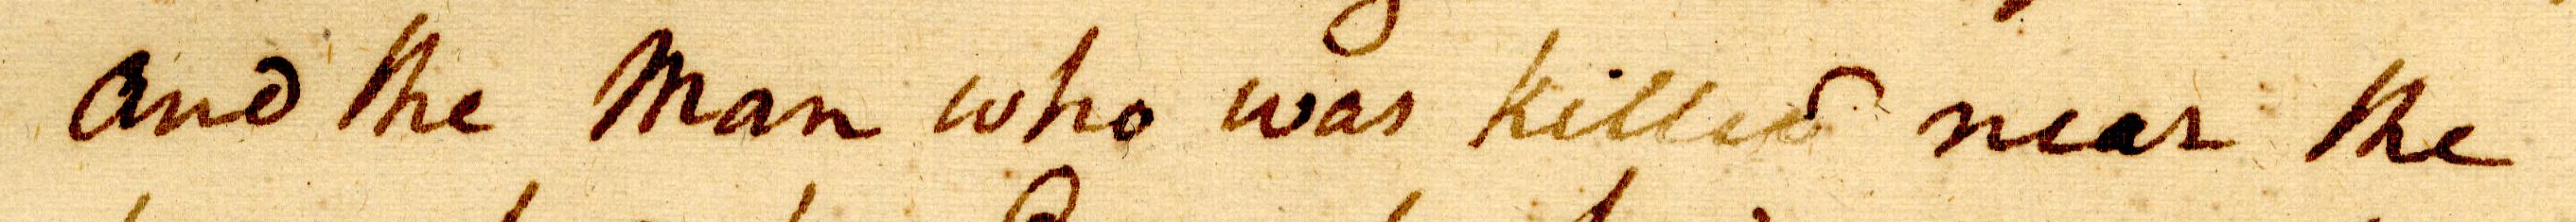and the Man who was killed near the
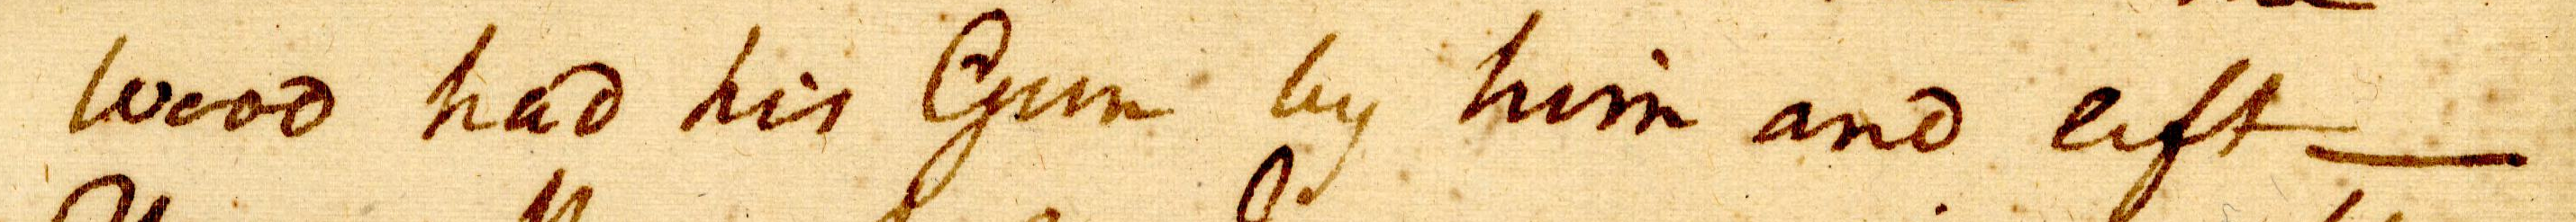wood had his Gun by him and left-
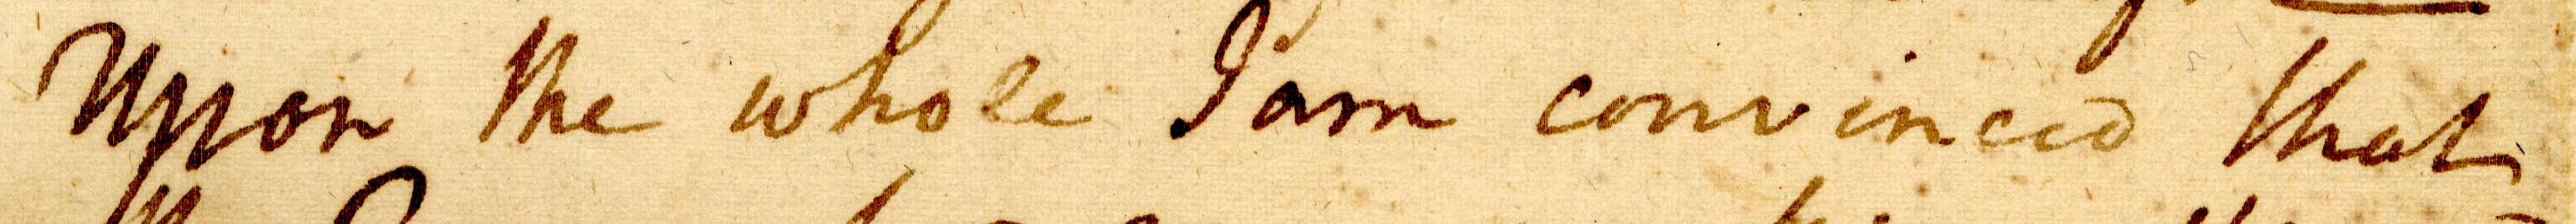Upon the whole I am convinced that
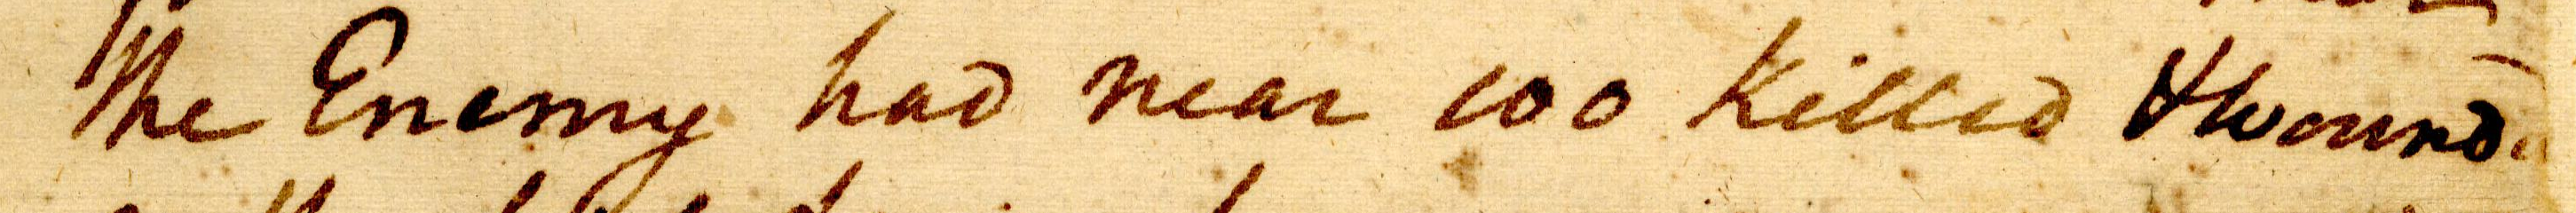the Enemy had near 100 killed & woundd
